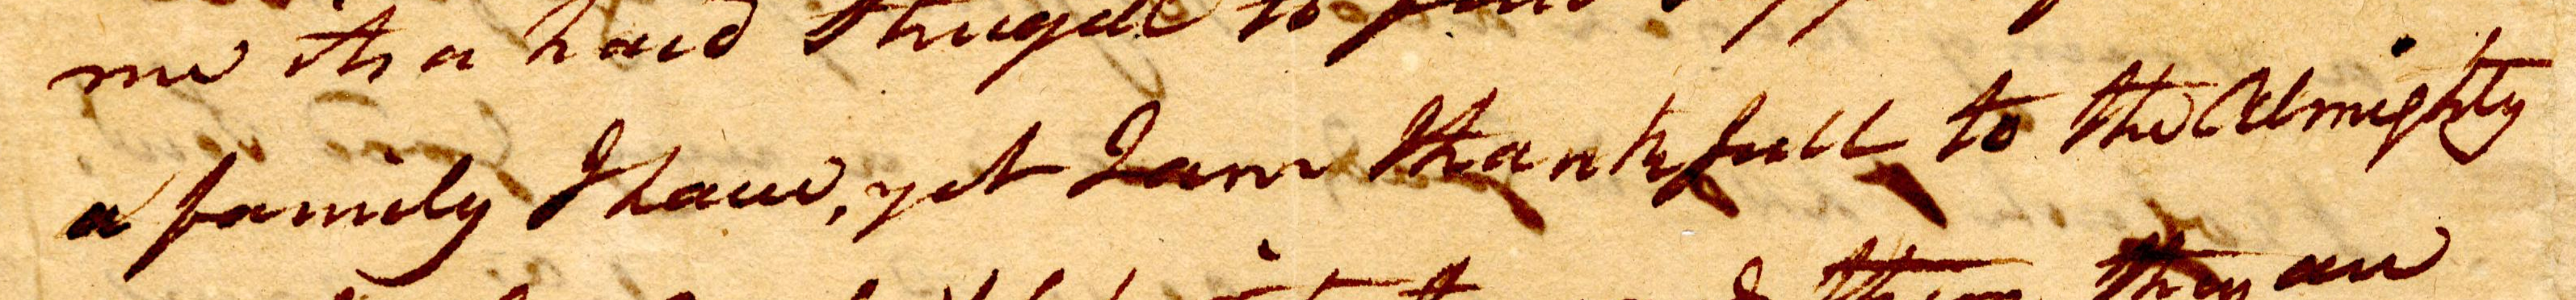a family I have, yet I am thankfull to the Almighty
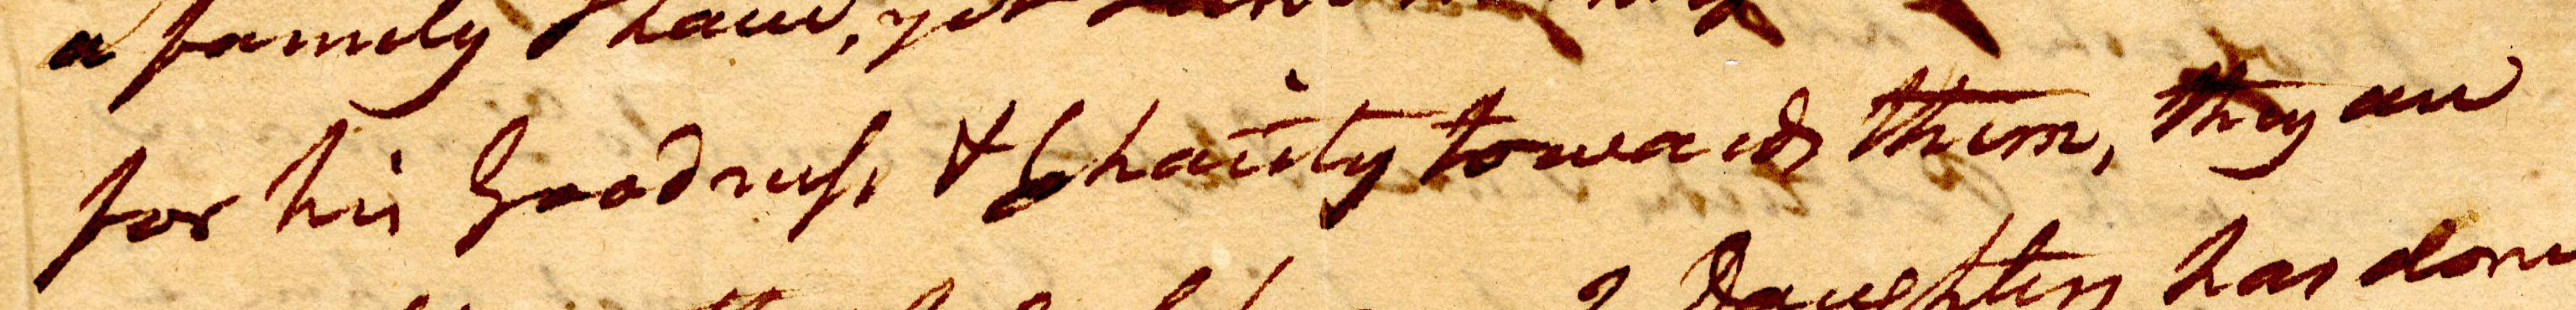for his Goodness & charity toward them, they are
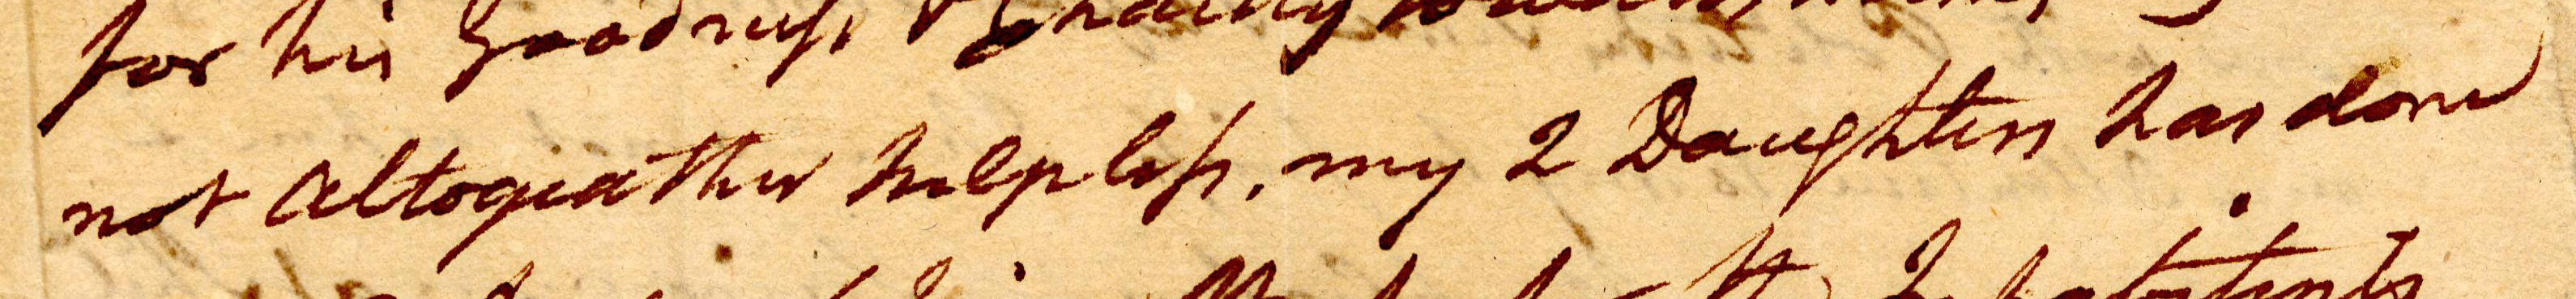not Altogether helpless, my 2 Daughters has done
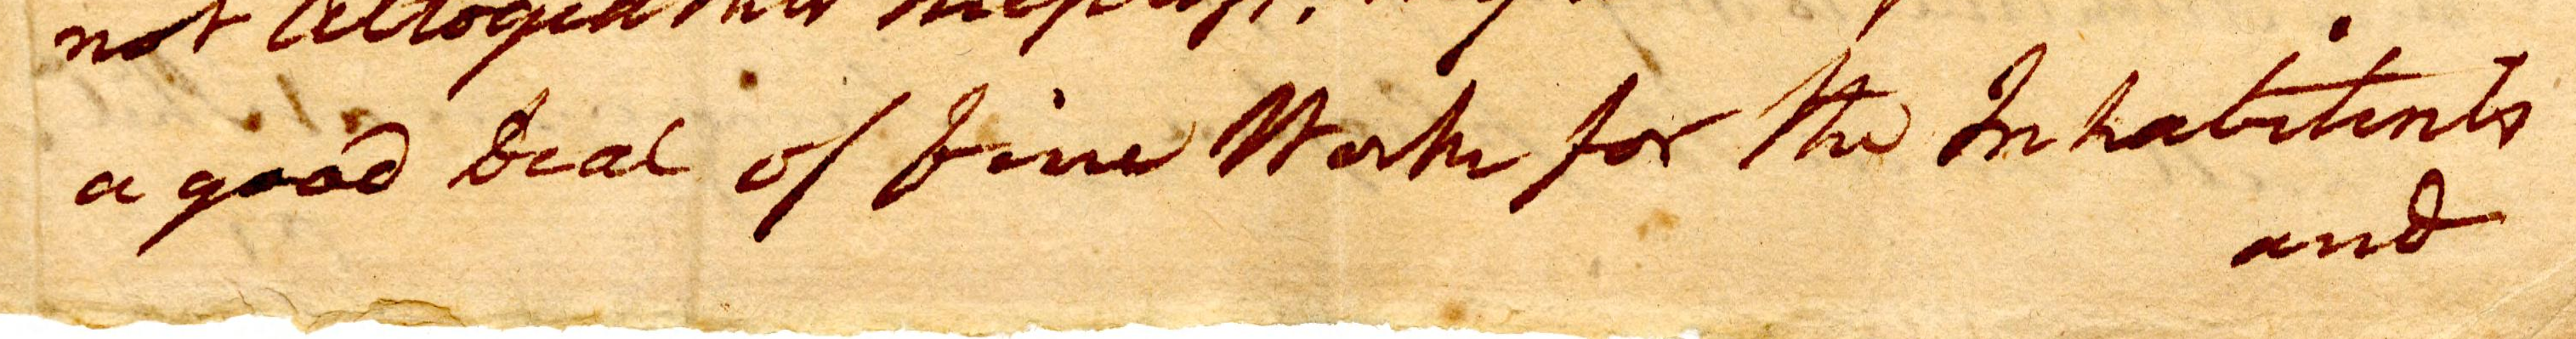a good Deal of fine Work for the Inhabitants
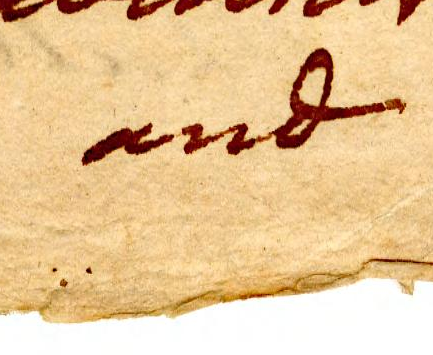and
